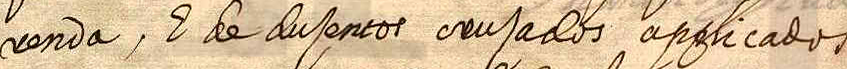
renda, E de duzentos cruzados applicados
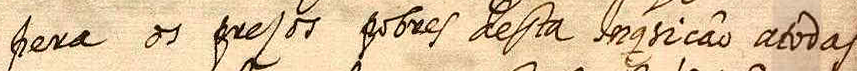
pera os prezos pobres desta Inꝗsição a todas
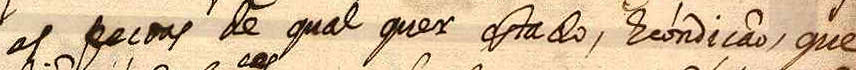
as peçoas de qualquer estado, E condição, que
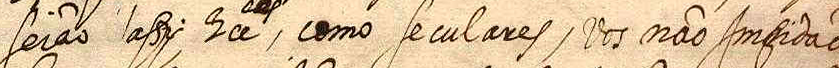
seião assy Ecccas, como seculares, vos não Jmpidaõ
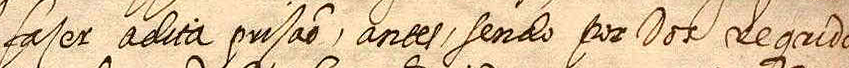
fazer a dita prizão, antes, sendo por vos reꝗrido
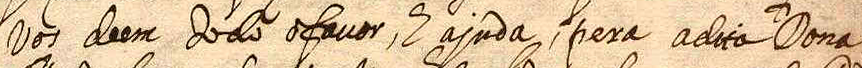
vos deem todo o fauor, E ajuda, pera a dita Dona
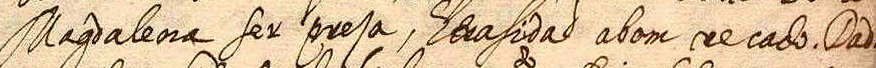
Magdalena ser preza, E trasida a bom recado. Dado
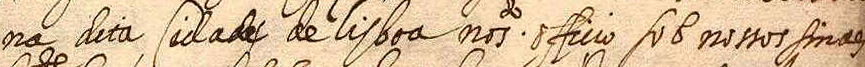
na dita Cidade de lisboa no sto. offiçio sob nossos sinaes
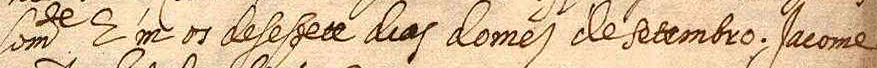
somte Em os desessete dias do mez de setembro. Jacome
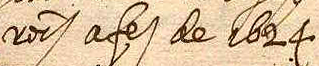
roīz a fez de 1624
